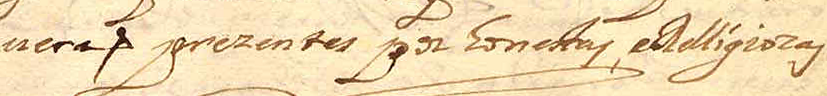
ueraõ prezentes por honestas, e Relligiozas
